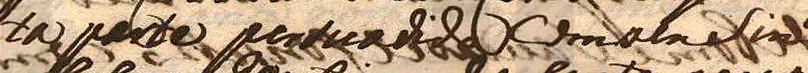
ta parte persuadido com o ensino
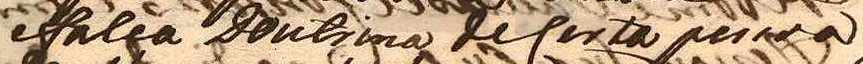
e falça Doutrina de Certa pessoa
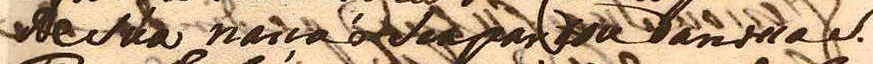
de sua nasçaõ se apartou da nossa S.
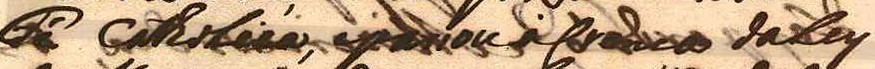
Fé Catholica, e passou a Crença da Ley
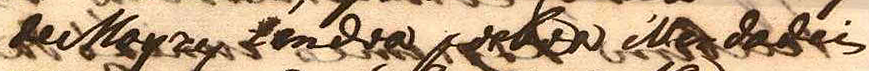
de Moyzes tendoa por boa e uerdadei
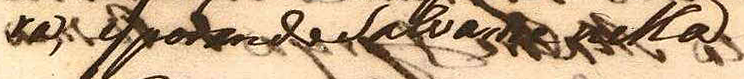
ra, esperando salvarsse nella
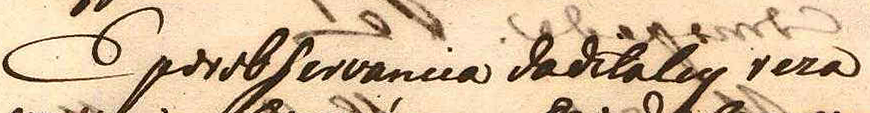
E por observancia da dita ley reza
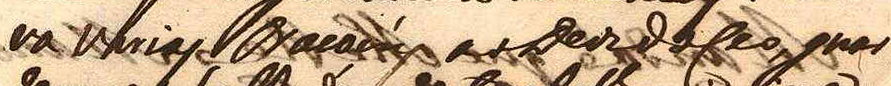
va varias Oraçoens ao Deos do Ceo, guar
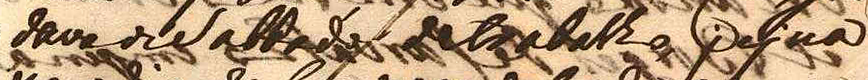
dava os Sabbados de trabalho jejua
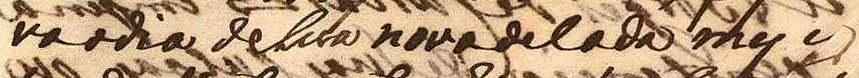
va o dia de lua nova de Cada mes e
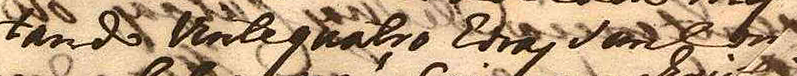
tando vinte quatro horas sem Com
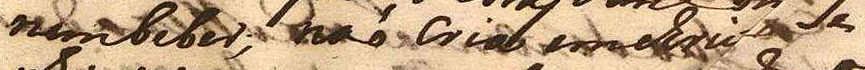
nem beber; naõ cria em christ_ se
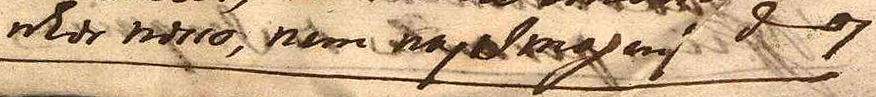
nhor nosso, nem nas almas ens_ dos
